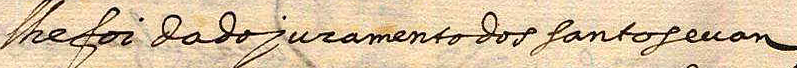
lhe foi dado juramento dos santos euan
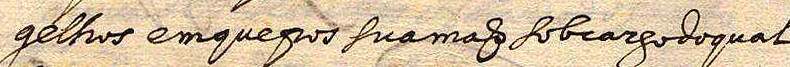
gelhos em que pos sua maõ sob cargo do qual
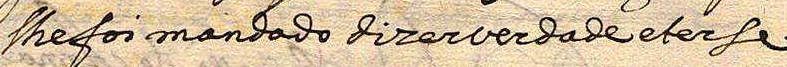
lhe foi mandado dizer verdade e ter se
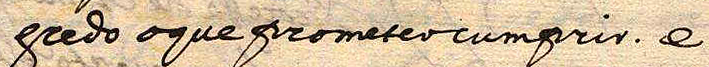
gredo o que prometeo cumprir. e
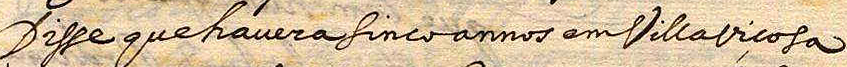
Disse que hauera sinco annos em Villa viçosa
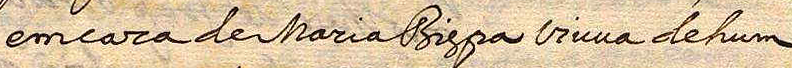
em caza de Maria Bispa viuua de hum
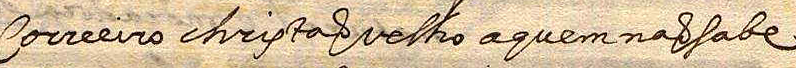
Correeiro christaõ velho a quem naõ sabe
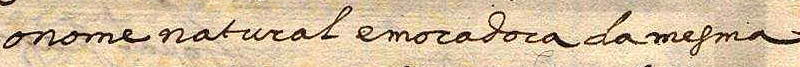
o nome natural e moradora da mesma
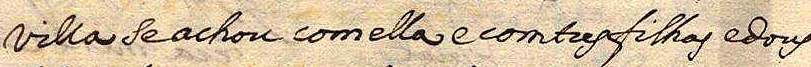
villa se achou com ella e com tres filhas e dous
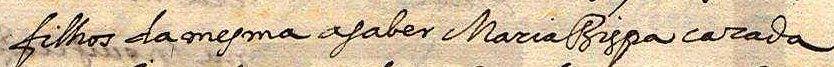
filhos da mesma a saber Maria Bispa cazada
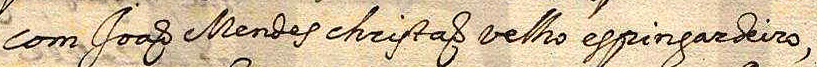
com Joaõ Mendes christaõ velho espingardeiro,
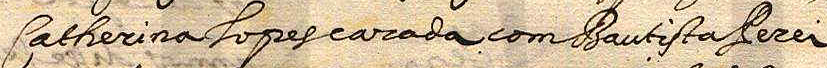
Catherina Lopes cazada com Bautista Perei
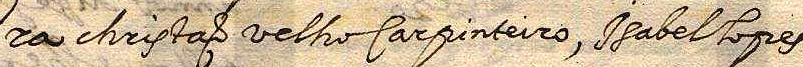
ra christaõ velho Carpinteiro, Isabel lopes
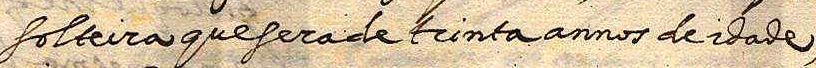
solteira que sera de trinta annos de idade,
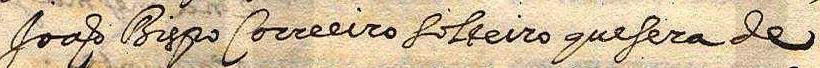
Joaõ Bispo Correeiro solteiro que sera de
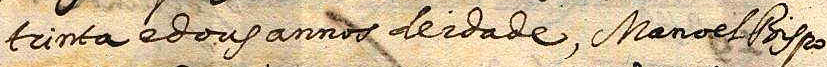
trinta e dous annos de idade, Manoel Bispo
